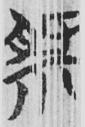祭
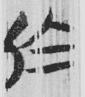於
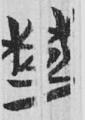楚
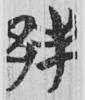邦
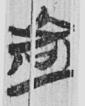者
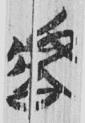○（乎）
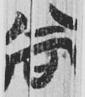尚（當）
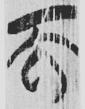而
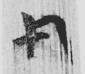卜
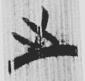之
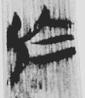於
